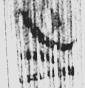之
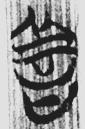善
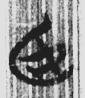臣
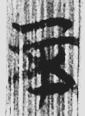不
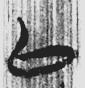㠯（以）
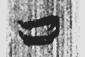厶（私）
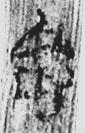思〈惠〉
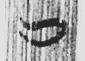厶（私）
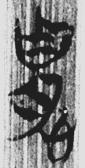悁（怨）
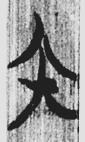內（入）
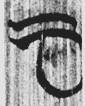于
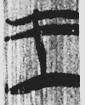王
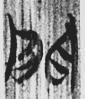門
